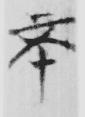不
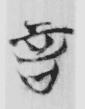言
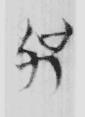加
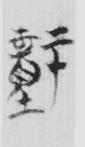{童主}
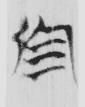於
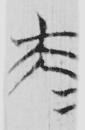夫=
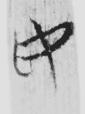女
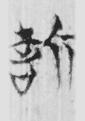{十言斤}
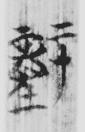{童主}
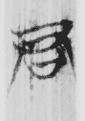君
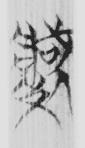{爿或死}
